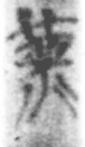黃
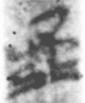爲
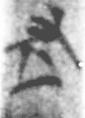○（右）
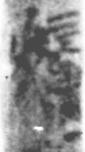○（服）
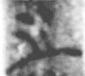之
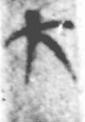大
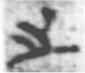之
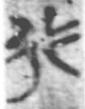行
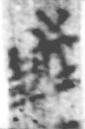○（廣）
